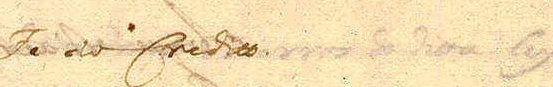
Fe do Credito.
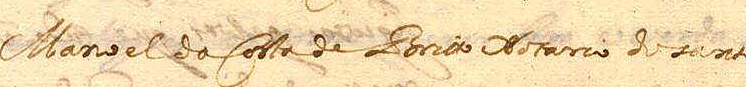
Manoel da Costa de Britto Notario do santo
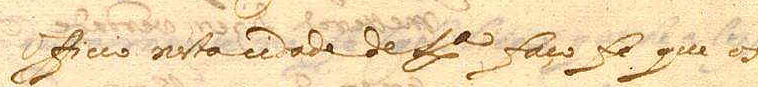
Officio nesta cidade de Lxa faço fe que os
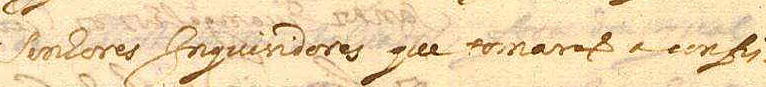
Senhores Jnquisidores que tomaraõ a confis
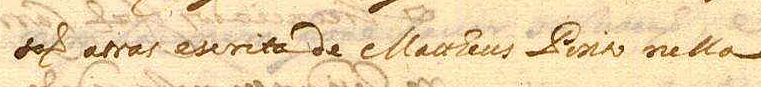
saõ atras escrita de Mattheus Pinto nella
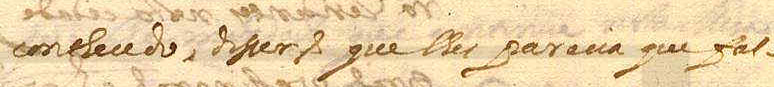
contheudo, disseraõ que lhes parecia que fal
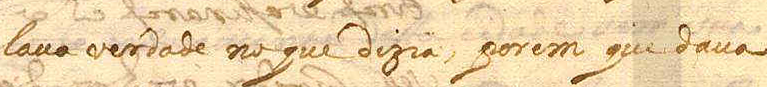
laua verdade no que dizia, porem que daua
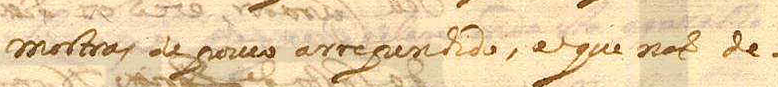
mostras de pouco arrependido, e que naõ de
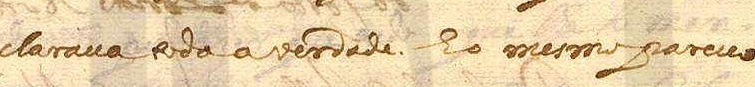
claraua toda a verdade. E o mesmo pareceo
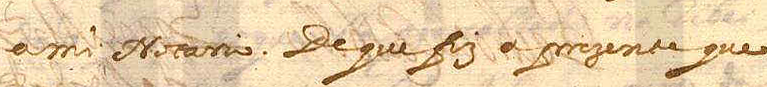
a mī. Notario. De que fiz o prezente que
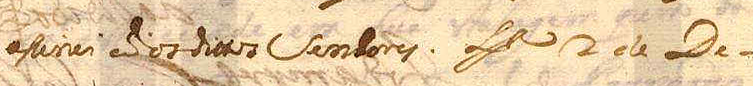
assinei cō os dittos Senhores. Lxa 2 de De
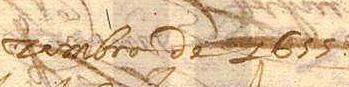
zembro de 1655.
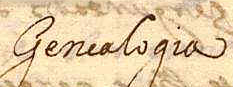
Genealogia
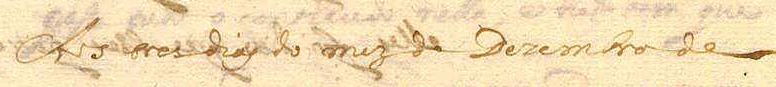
Aos tres dias do mez de Dezembro de
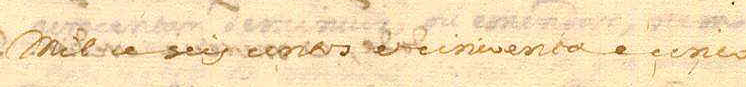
mil e seiscentos e cincoenta e cinco
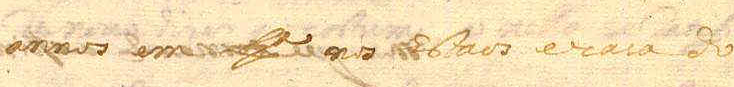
annos em Lxa nos Estaos e casa do
